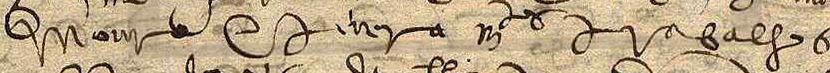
Mouro e tiuera mtos trabalhos
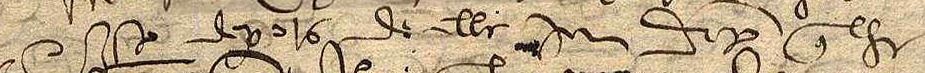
e Jsto depois de elle ter dito q̄ lhe
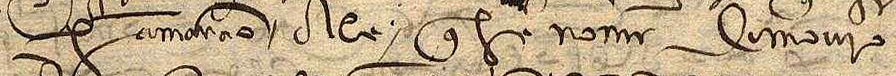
chamauão / Ale / q̄ he nome de mouro
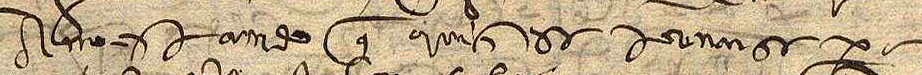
Amoestamdo q̄ quisese tornarse ꝑa
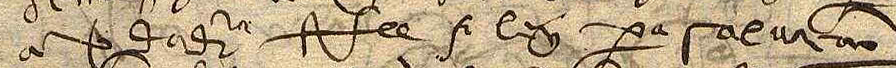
a ꝟdadra ffee e ley ꝑa saluação
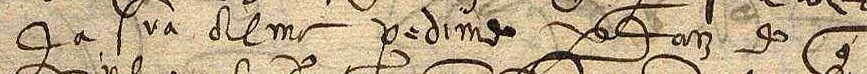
da sua Alma pedimdo ꝑdam do q̄
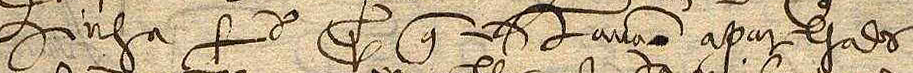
tinha fto p̄oq̄ estauão aparelhados
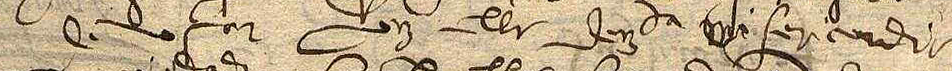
de vsar Com elle de mta misericordia
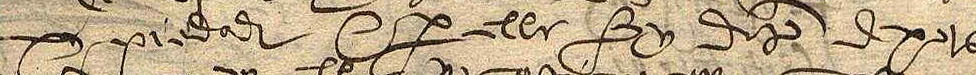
e piedade e ꝑ elle foy dit̄o depois
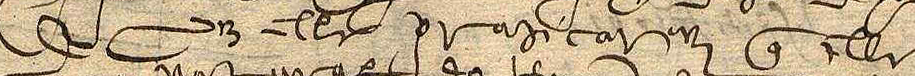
de Com elle praticarem q̄ elle
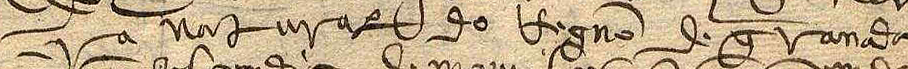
era natural do Regno de granada
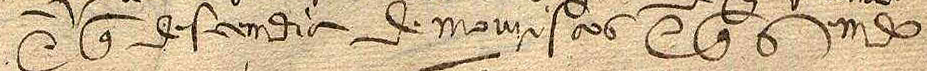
e q̄ descemdia de mouriscos e q̄ semdo
